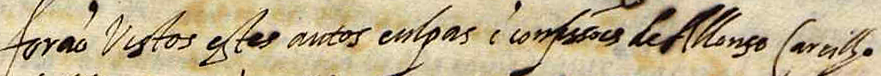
foraõ Vistos estes autos culpas e confissões de Allonço Carrilho
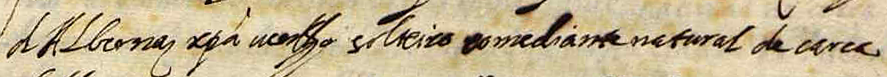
dAlbernaz xpā uelho solteiro comediante natural de carca
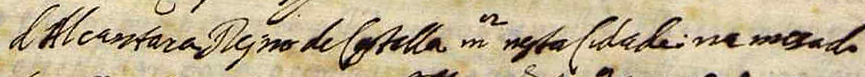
dAlcantara Rejno de Castella mor nesta Cidade na mesa do
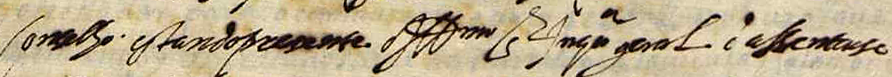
Conselho. estando presente o Jllmo sor Jnquor geraL e assentouse
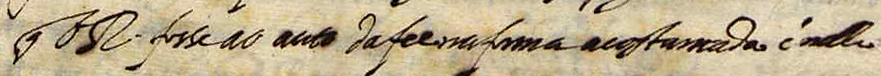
q̄ o R. fosse ao auto da fee na forma acostumada, e nelle
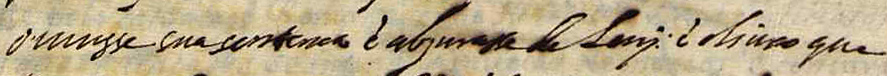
ouuisse sua sentença e abjurasse de Leuj: e o liuro que
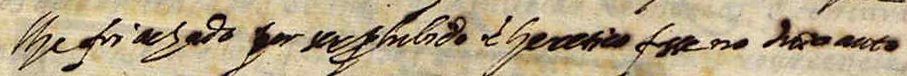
lhe foi achado por ser ꝓhibido e heretico fosse no dito auto
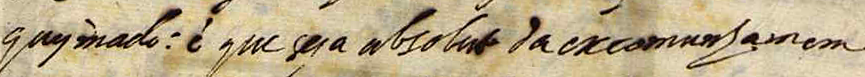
quejmado: e que sera absoluto da excomunham em
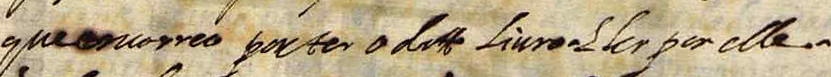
que encorreo por ter o ditto liuro E ler por elle.
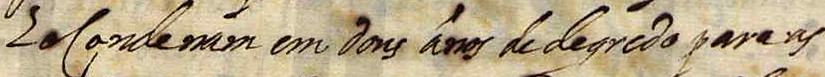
E o Condenam em dous an̄os de degredo para as
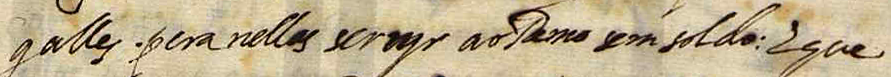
galles pera nelles serujr ao Remo sem soldo: E que
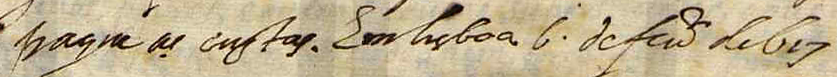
pague as custas. Em lisboa 6. de feuro de 617
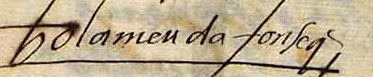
b̄olameu da fonseqa
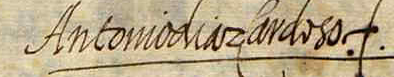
Antonio diaz Cardoso.
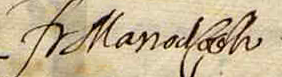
Fr. Manoel Coelho
